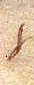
1
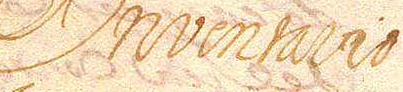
Inventario
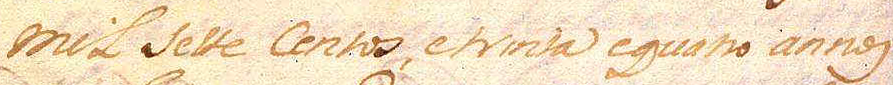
miL settecentos, e trinta e quatro annos
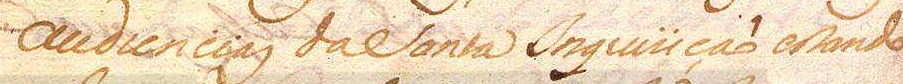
audiencias da santa Inquiziçaõ estando
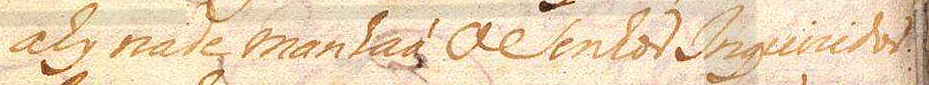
ahy na de manhaã o senhor Inquizidor
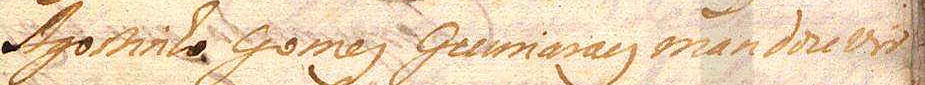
Agostinho Gomes Guimaraes mandou vir
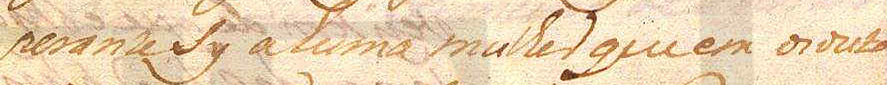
perante sy a huma mulher que em os outo
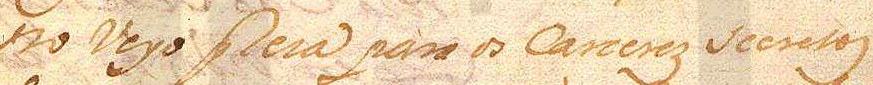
no veyo preza para os carcerez secretos
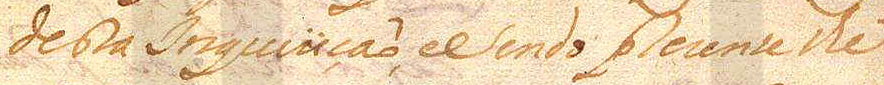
desta Inquiziçaõ, e sendo prezente lhe
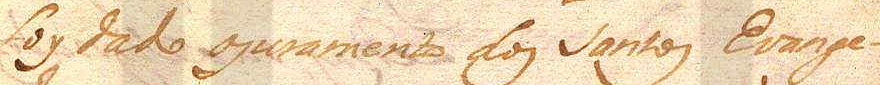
foy dado o juramento dos santos Evange
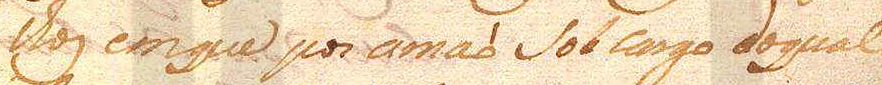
lhos em que pos a maõ sob cargo do qual
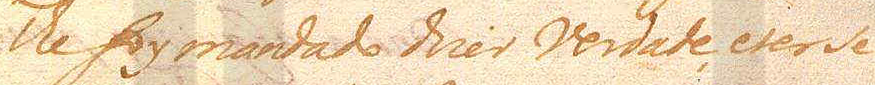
lhe foy mandado dizer verdade, e ter se
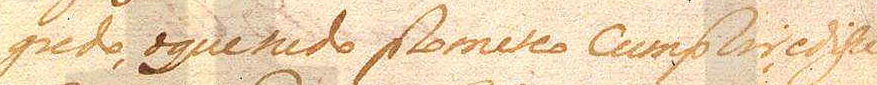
gredo, o que tudo prometeo cumprir, e disse
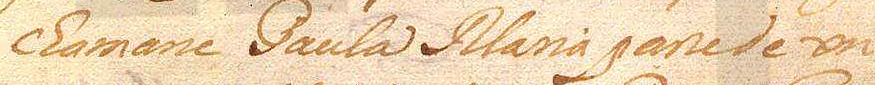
chamarse Paula Maria parte de xn
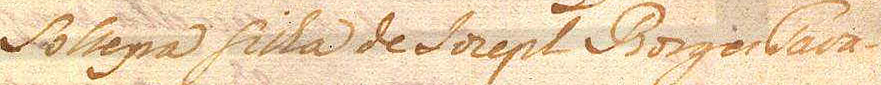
solteyra filha de Iozeph Borges Tava
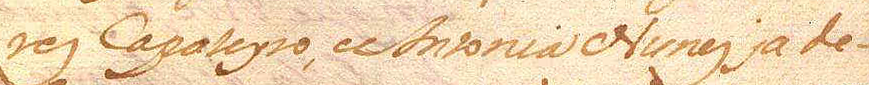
res Capateyro, e Antonia Nunes ja de
